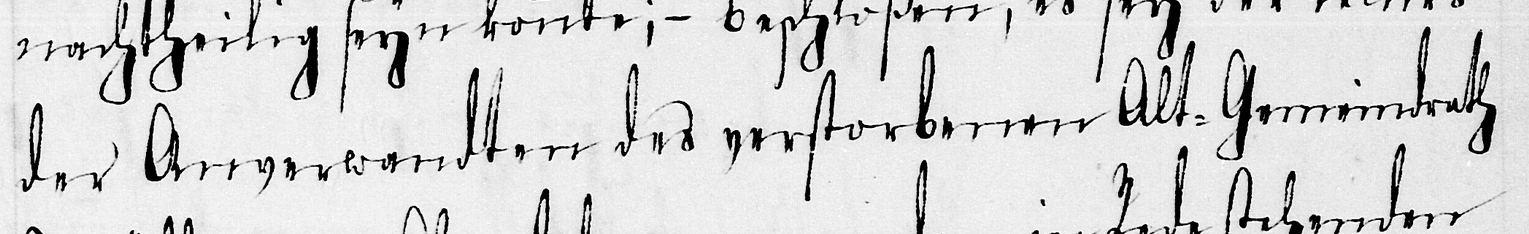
der Anverwandten des verstorbenen Alt-Gemeindrath
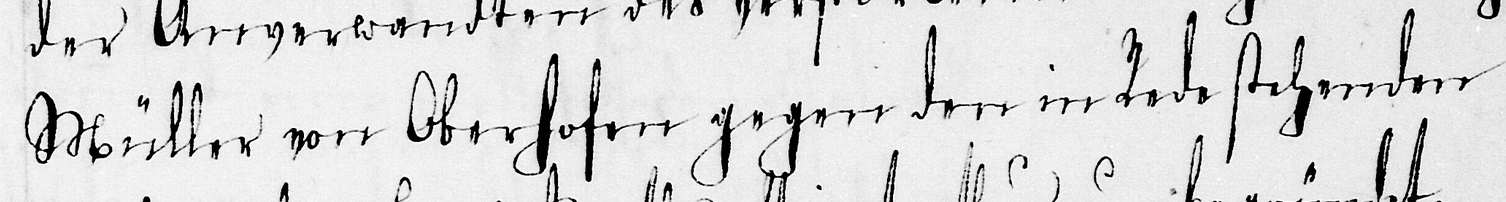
Müller von Oberhofen gegen den in Rede stehenden
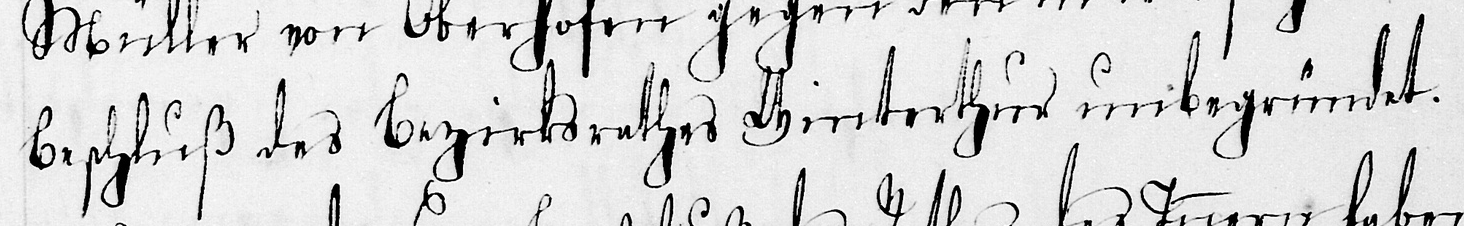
Beschluß des Bezirksrathes Winterthur unbegründet.
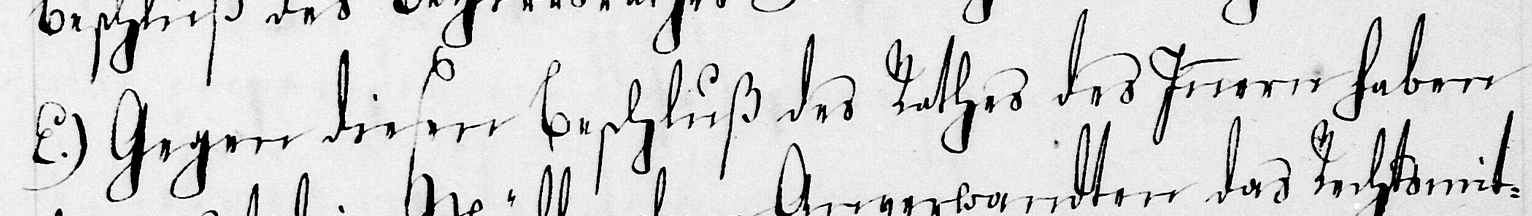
E.) Gegen diesen Beschluß des Rathes des Innern haben
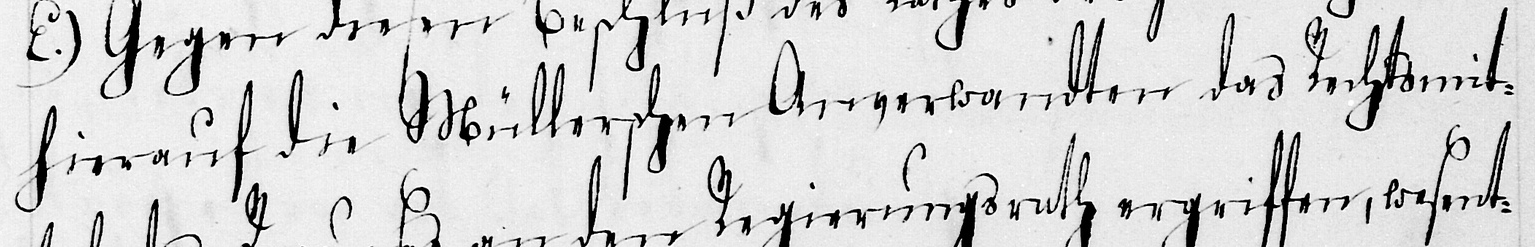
hierauf die Müllerschen Anverwandten das Rechtsmit¬
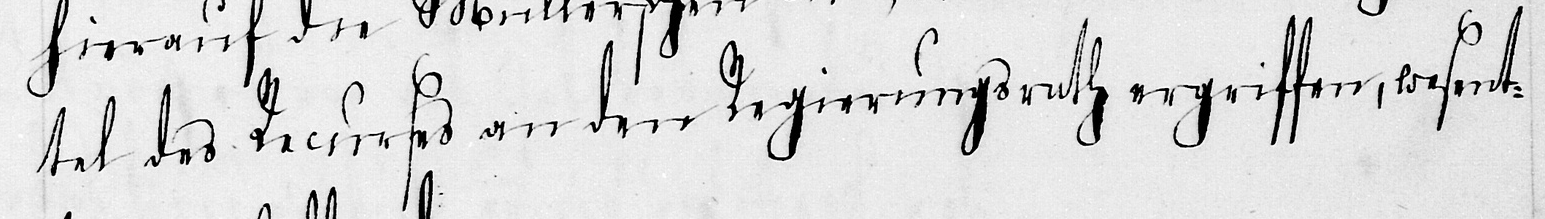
tel des Recurses an den Regierungsrath ergriffen, wesent¬
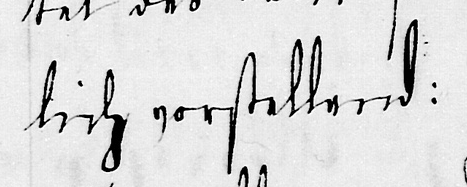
lich vorstellend:
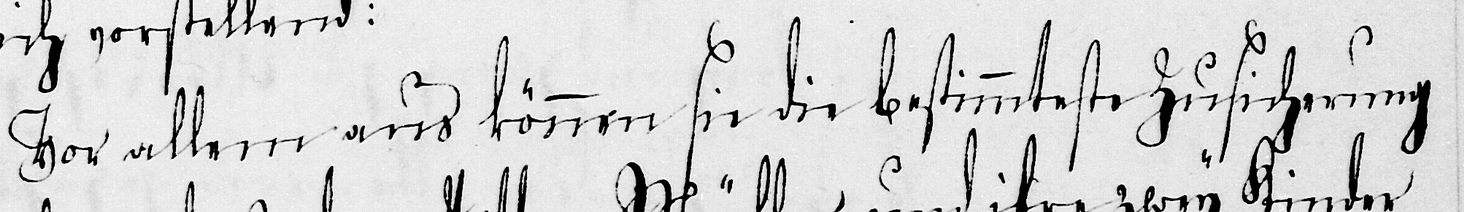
Vor allem aus können sie die bestimmteste Zusicherung
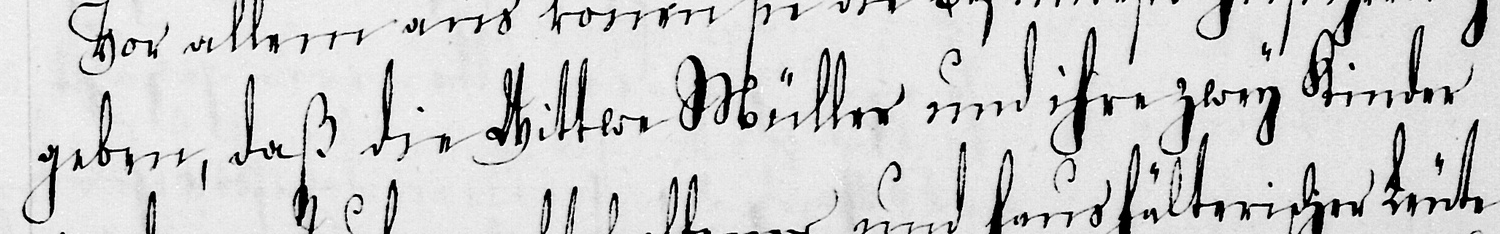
geben, daß die Wittwe Müller und ihre zwey Kinder
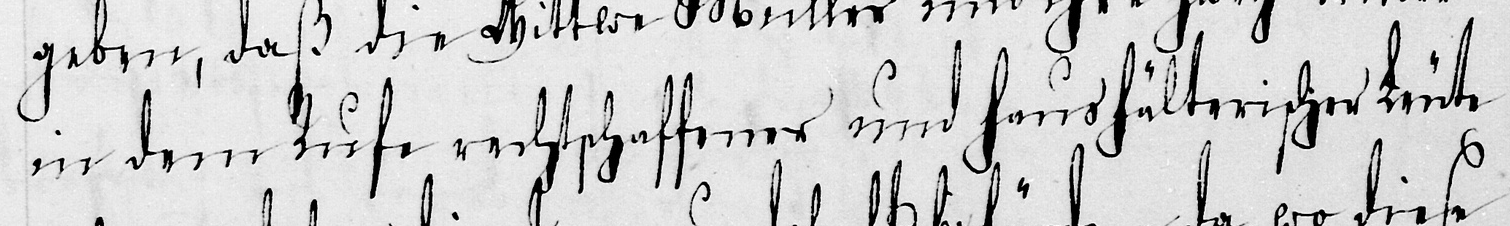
in dem Rufe rechtschaffener und haushälterischer Leu¬
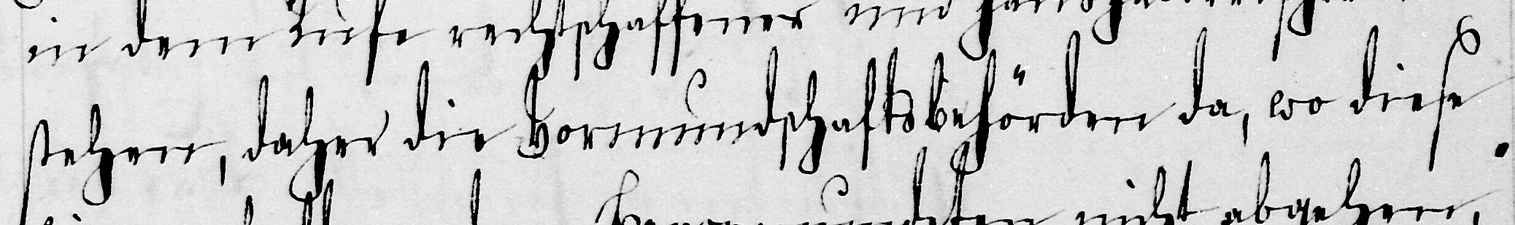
stehen, daher die Vormundschaftsbehörden da, wo diese
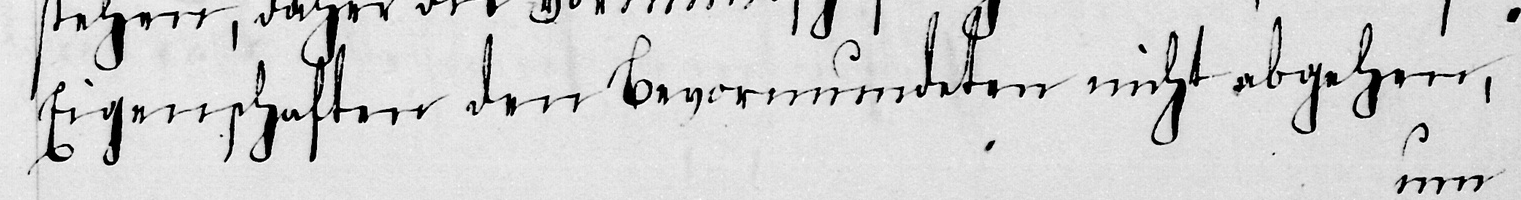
Eigenschaften den Bevormundeten nicht abgehen,
